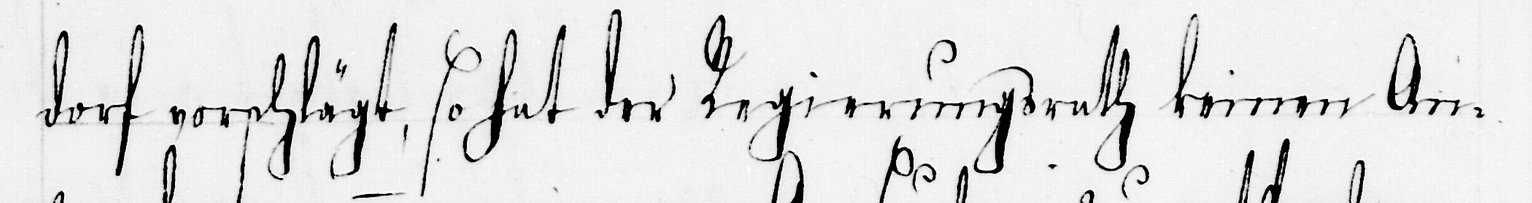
vorschlägt, so hat der Regierungsrath keinen An¬
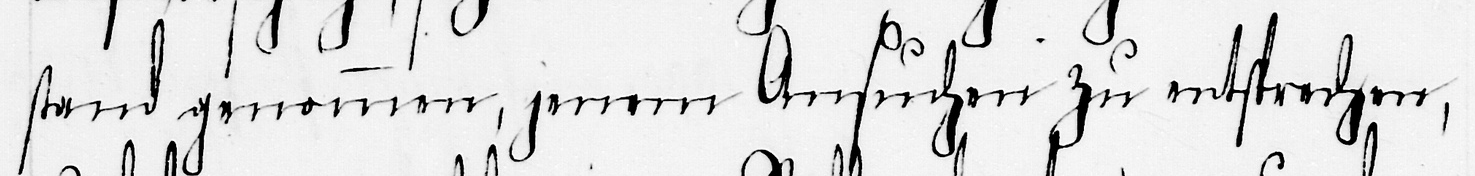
stand genommen, jenem Ansuchen zu entsprechen,
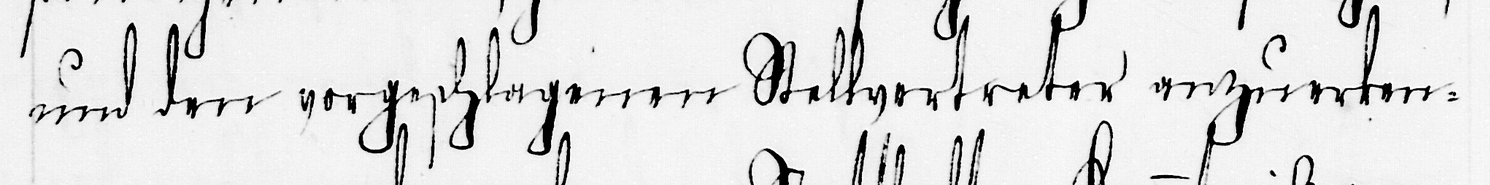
und den vorgeschlagenen Stellvertreter anzuerken¬
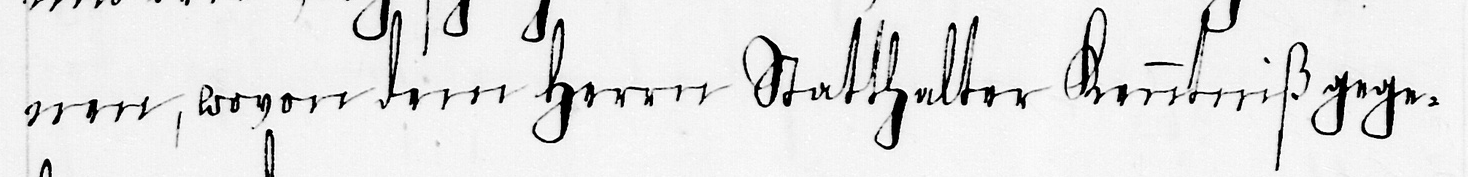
nen, wovon dem Herrn Statthalter Kenntniß gege¬
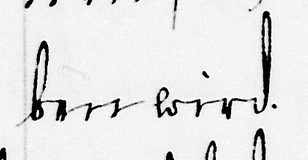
ben wird.
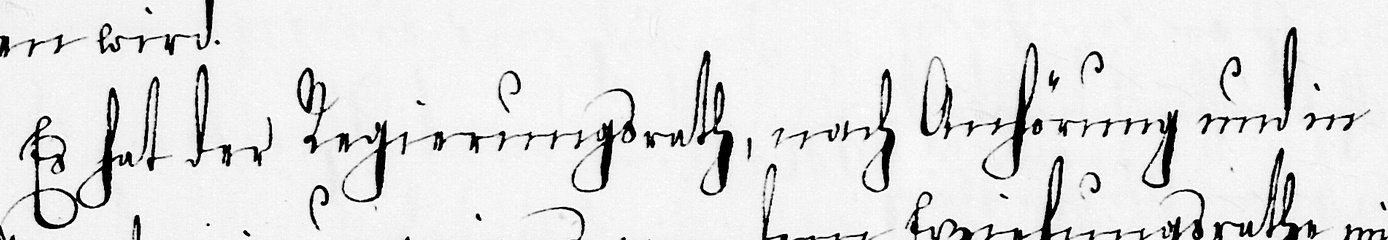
Es hat der Regierungsrath, nach Anhörung und in
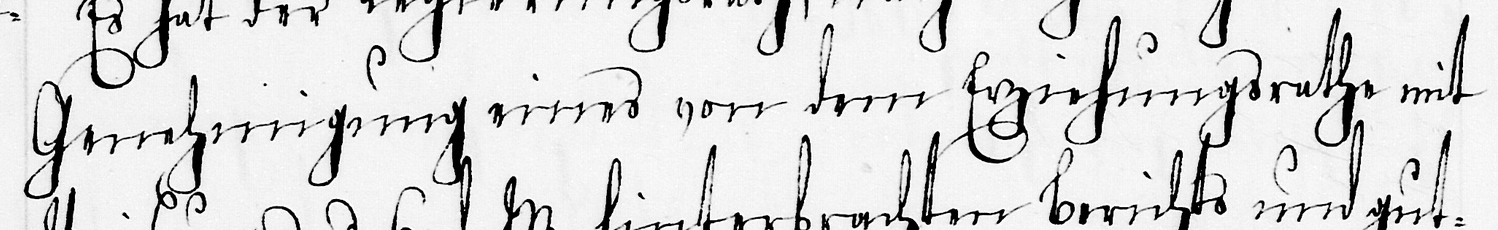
Genehmigung eines von dem Erziehungsrathe mit
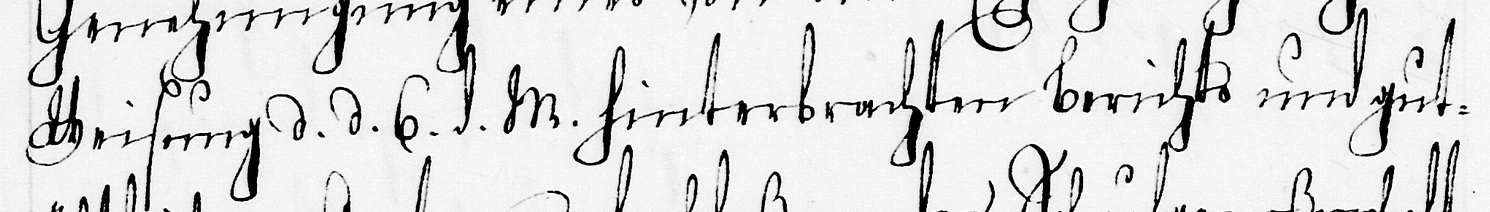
Weisung d. d. 6. d. M. hinterbrachten Berichts und gut¬
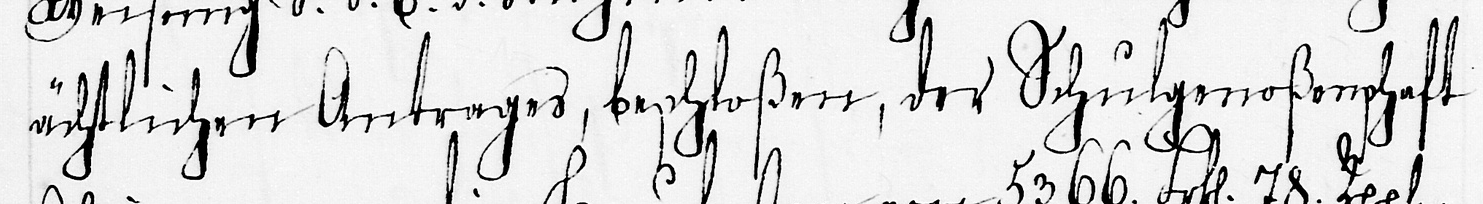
ächtlichen Antrages, beschloßen, der Schulgenoßenschaft
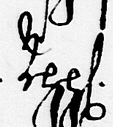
dorf
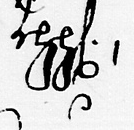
78.
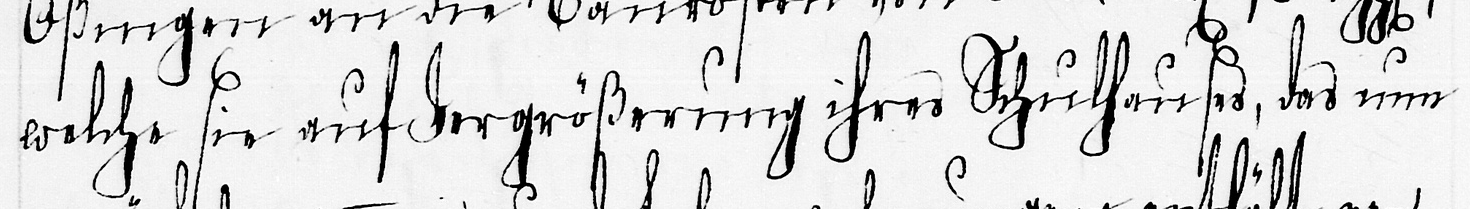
welche sie auf Vergrößerung ihres Schulhauses, das nun
